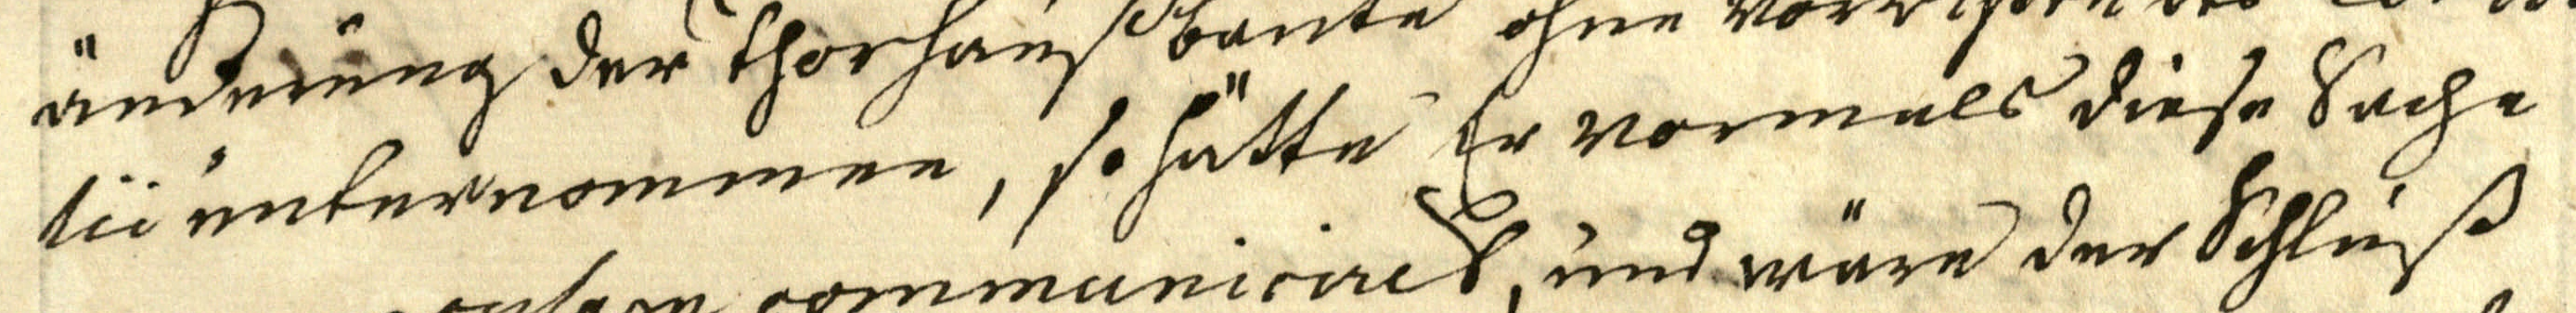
lii unternommen, so hätte Er vormals diese Sache
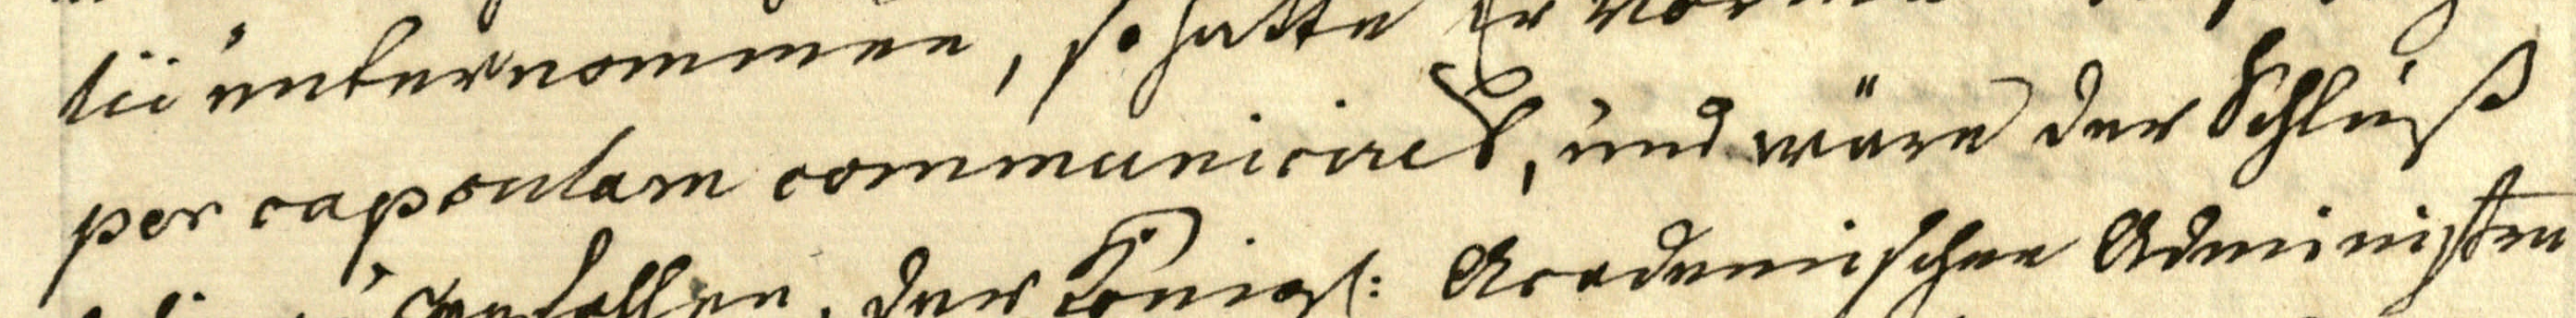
per capsulam communiciret, und wäre der Schluß
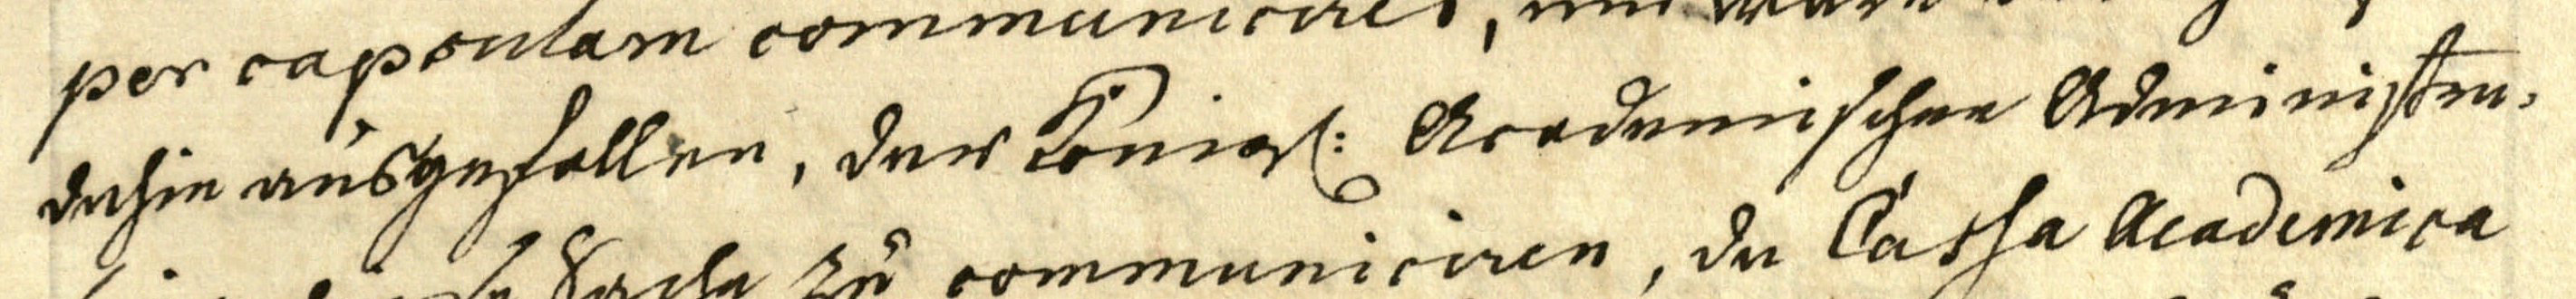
dahin ausgefallen, der Königl. Academischen Administra¬
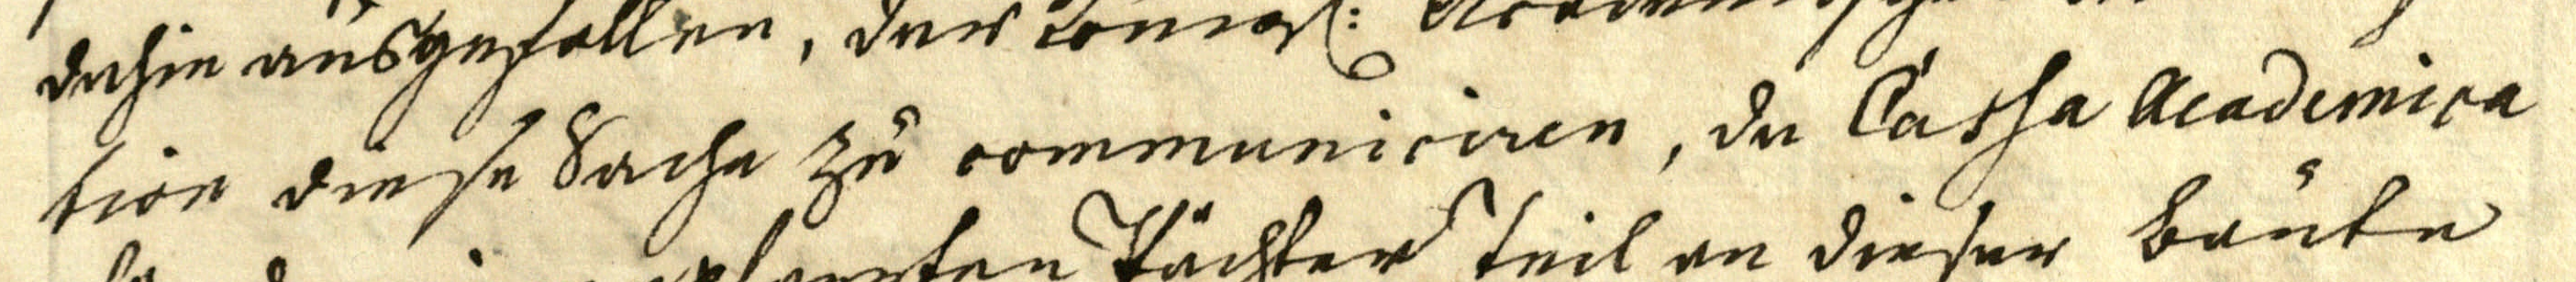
tion diese Sache zu communiciren, da Cassa Academica
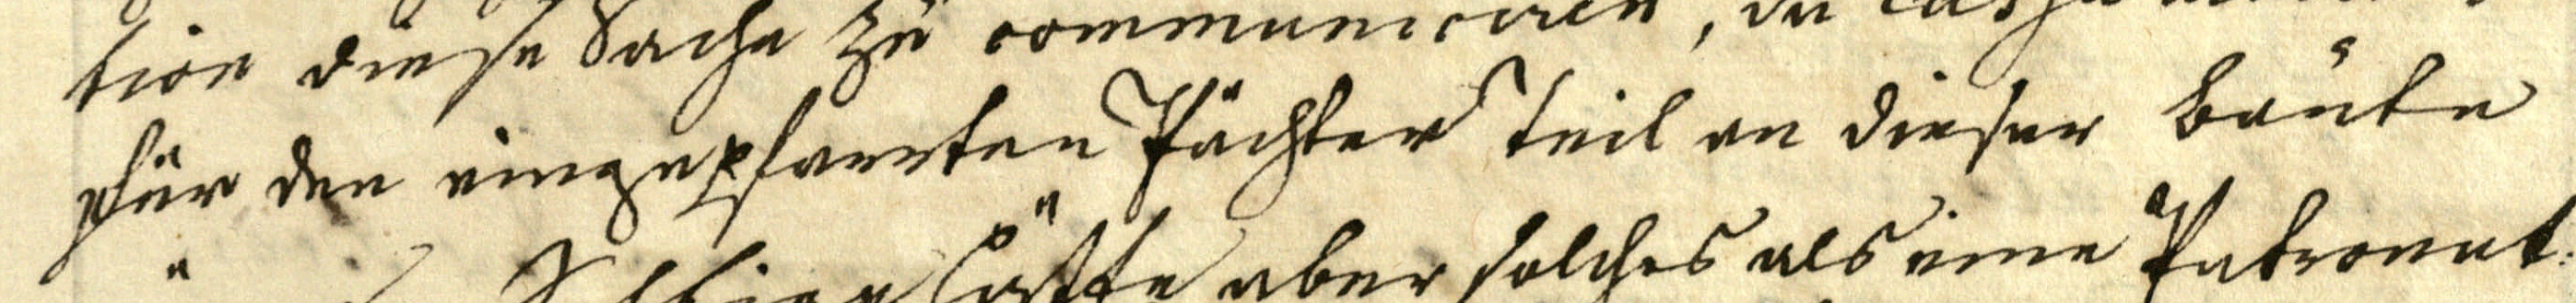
für den eingepfarrten Pächter Teil an dieser Baute
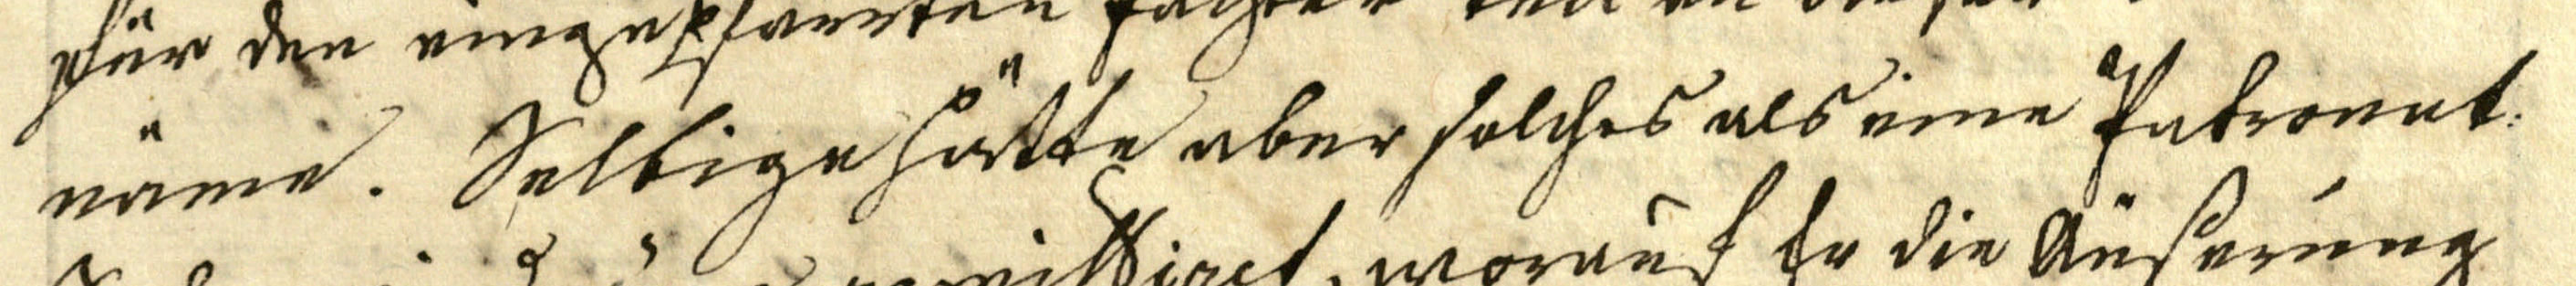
näme. Selbige hätte aber solches als eine Patronat¬
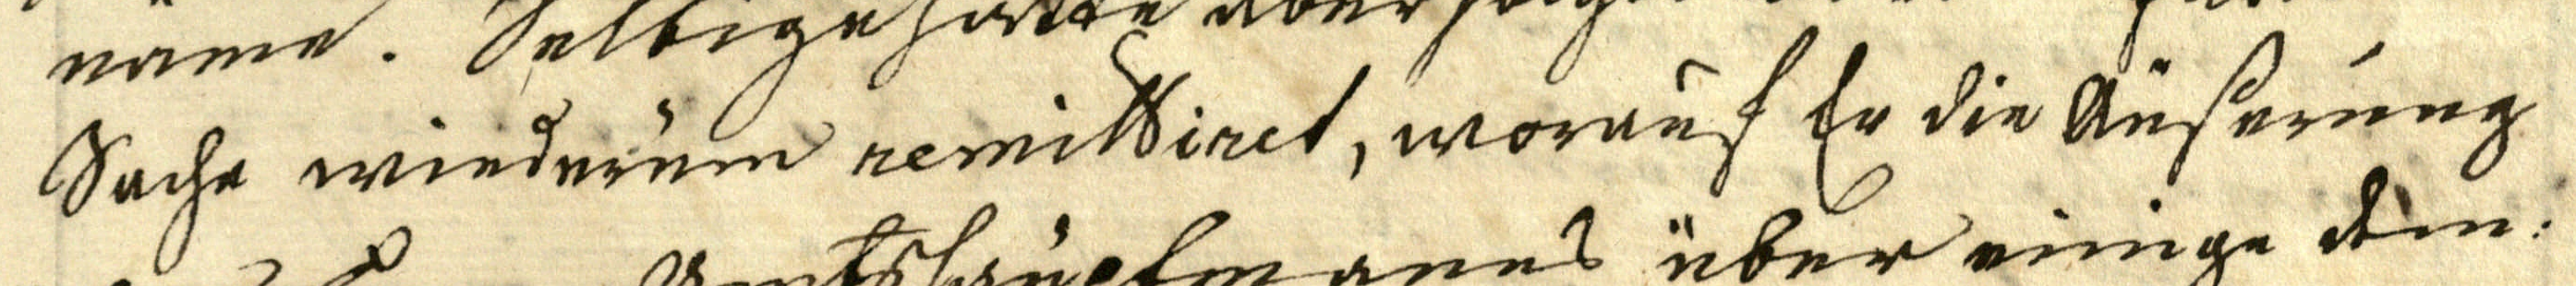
Sache wiederum remittiret, worauf Er die Äußerung
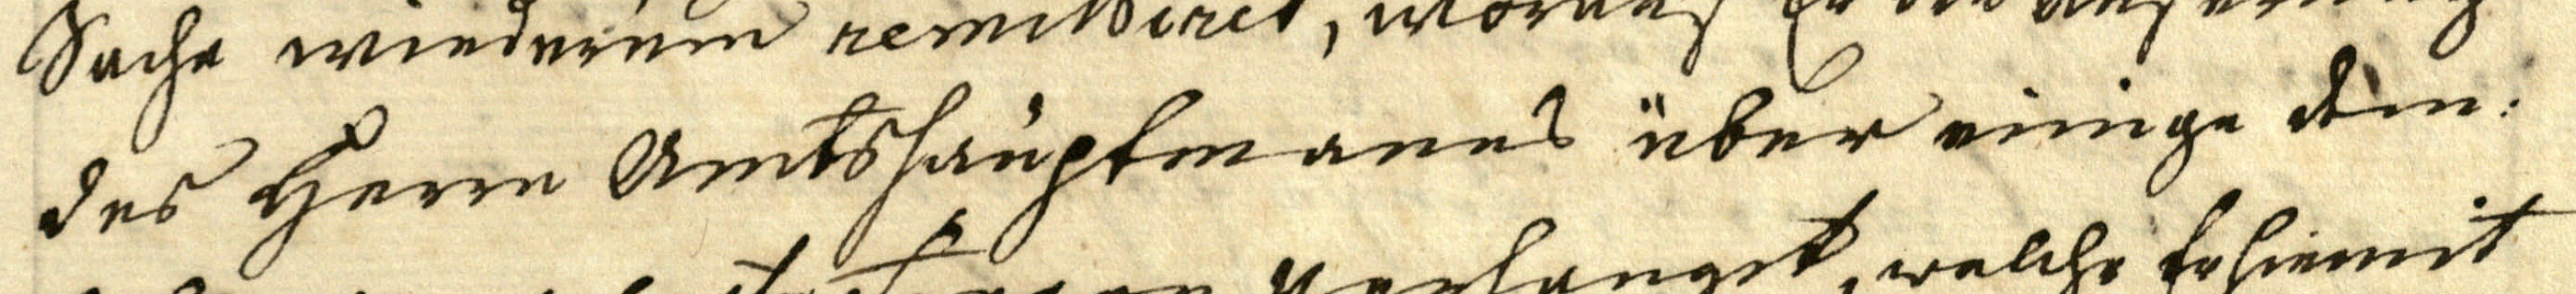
des Herrn Amtshauptmanns über einige dem¬
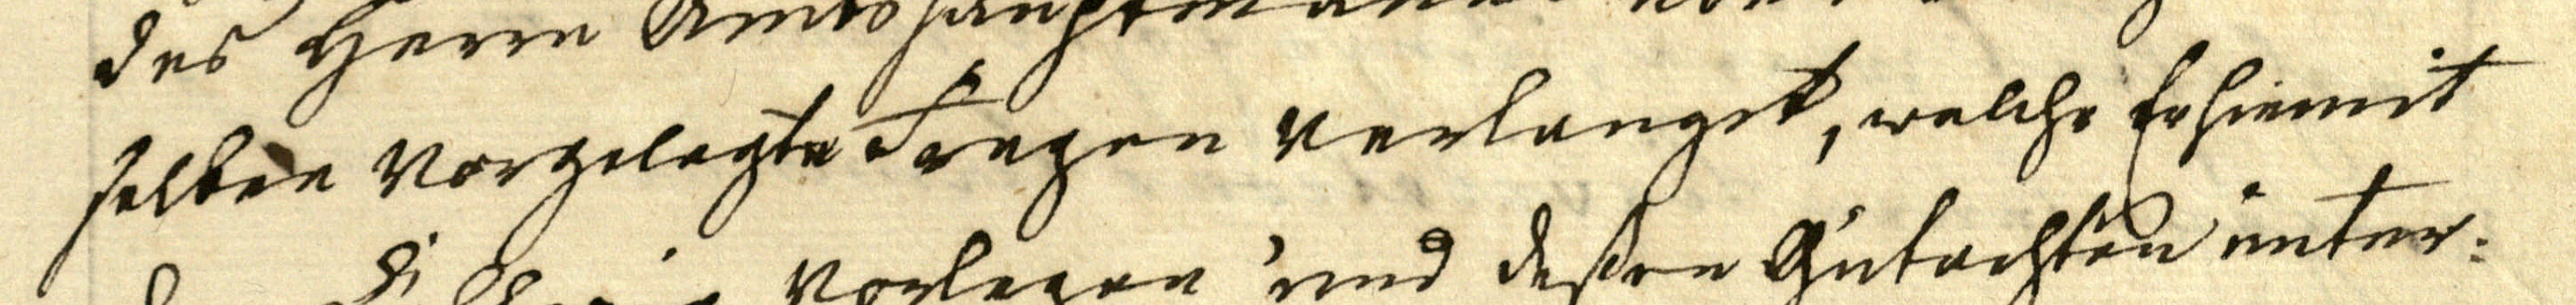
selben vorgelegte Fragen verlanget, welche Er hiemit
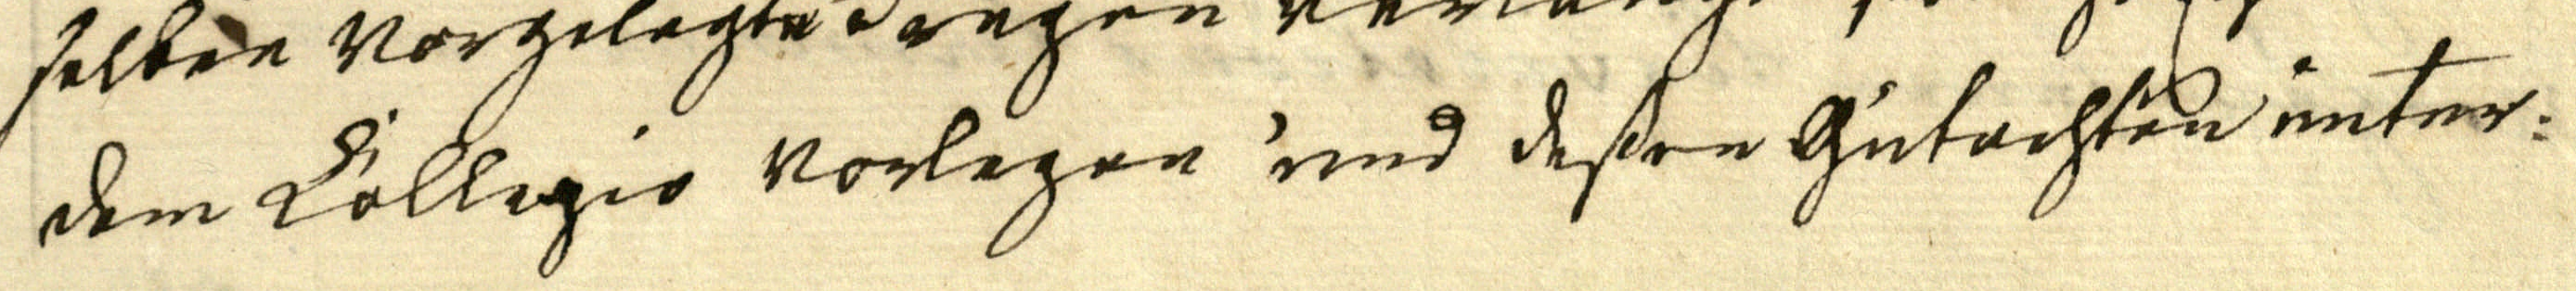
dem Collegio vorlegen und deßen Gutachten unter¬
